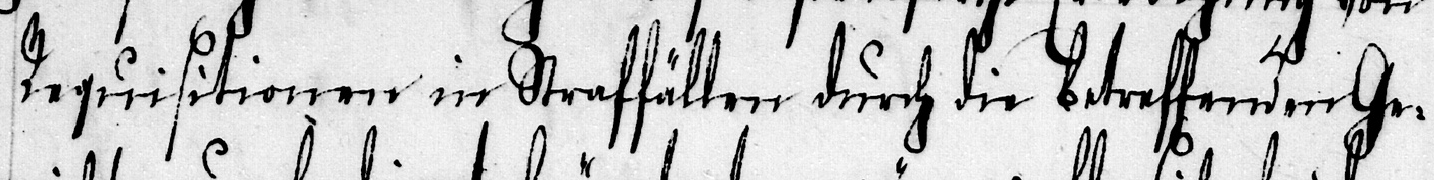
Requisitionen in Straffällen durch die betreffenden Ge¬
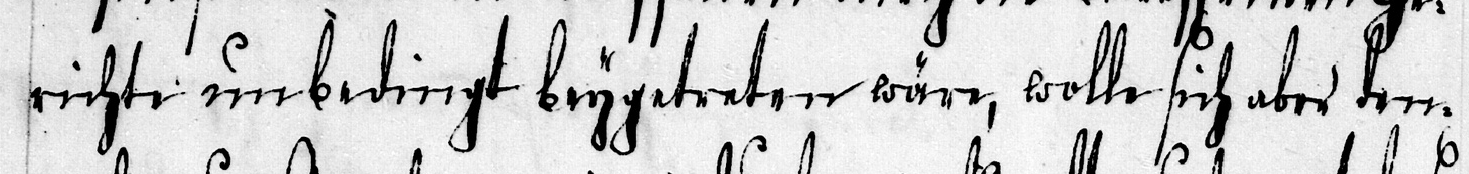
richte unbedingt beygetreten wäre, wolle sich aber den¬
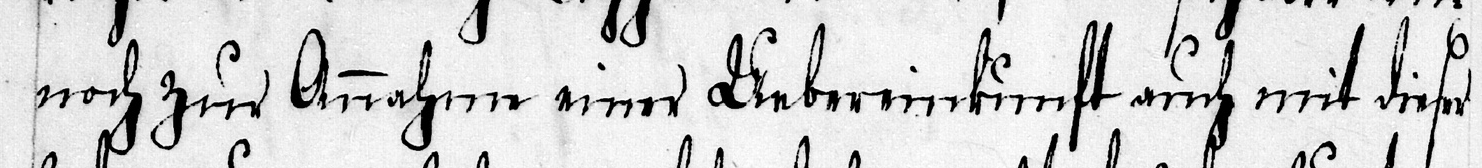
noch zur Annahme einer Uebereinkunft auch mit dieser
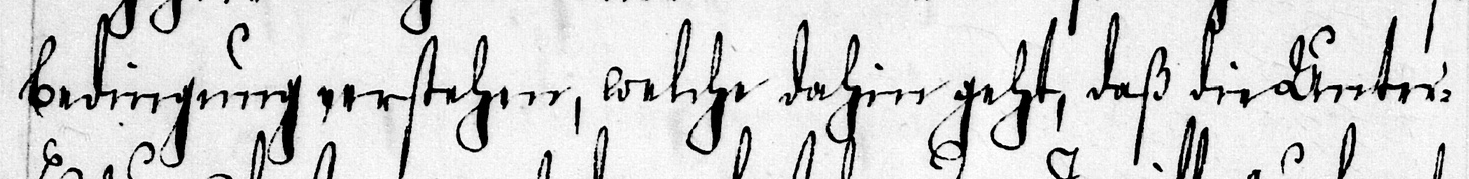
Bedingung verstehen, welche dahin geht, daß die Unter¬
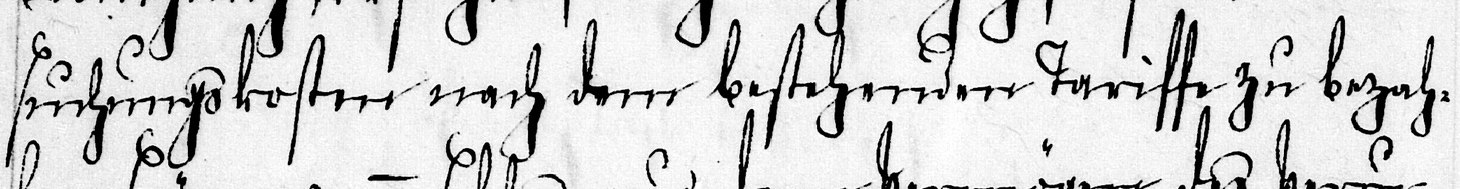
suchungskosten nach dem bestehenden Tariffe zu bezah¬
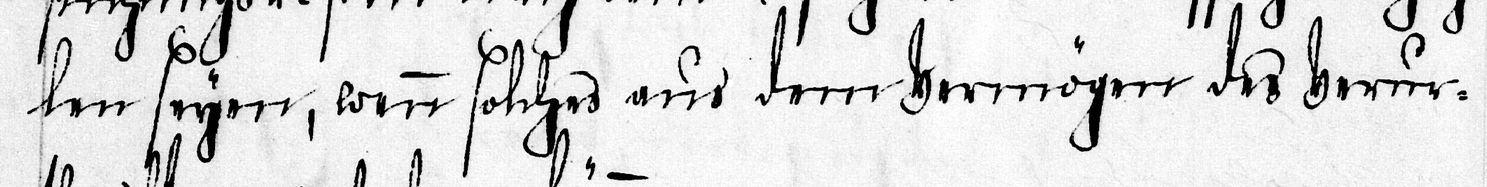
len seyen, wenn solches aus dem Vermögen des Verur¬
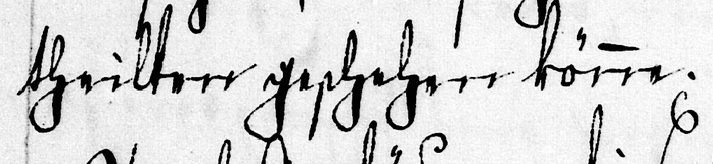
theilten geschehen könne.
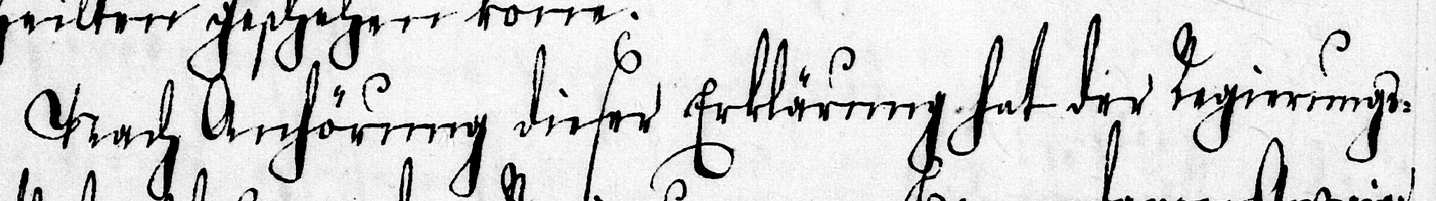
Nach Anhörung dieser Erklärung hat der Regierungs¬
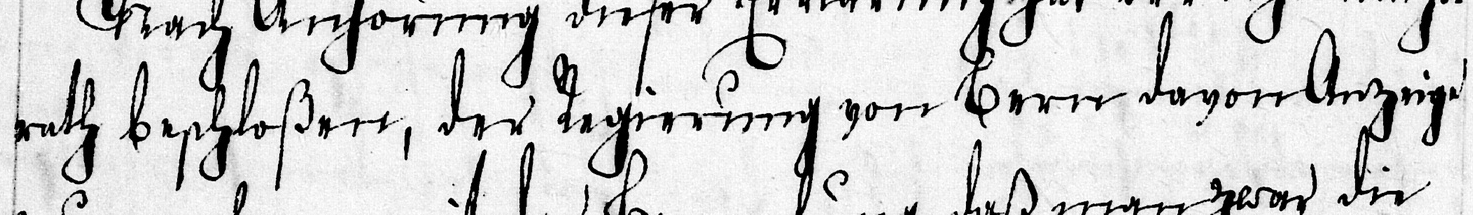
rath beschloßen, der Regierung von Bern davon Anzeige
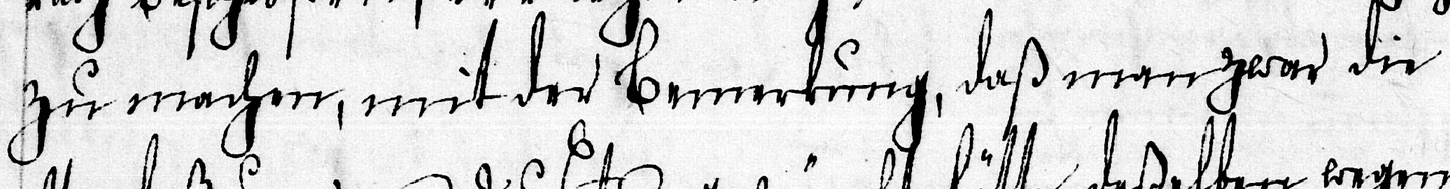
zu machen, mit der Bemerkung, daß man zwar die
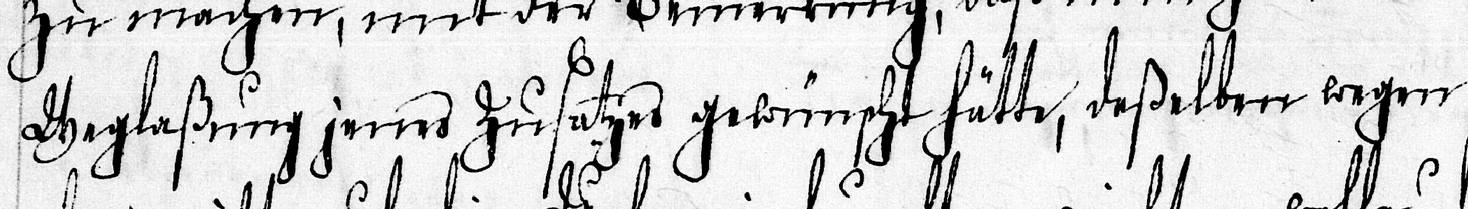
Weglaßung jenes Zusatzes gewünscht hätte, deßelben wegen
